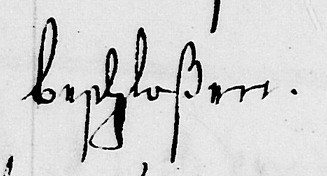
beschloßen.
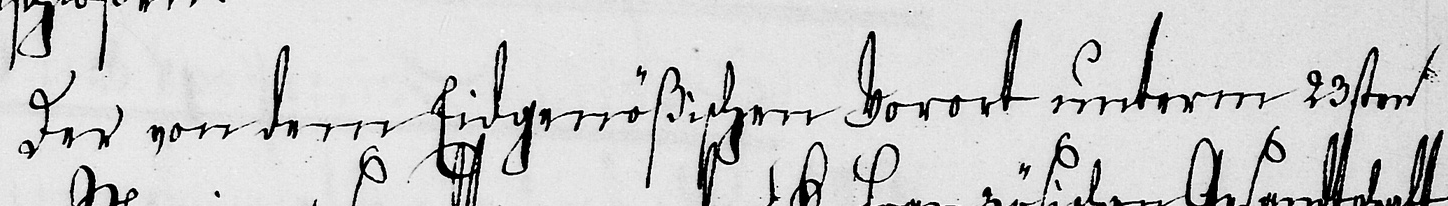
Der von dem Eidgenößischen Vorort unterm 23sten
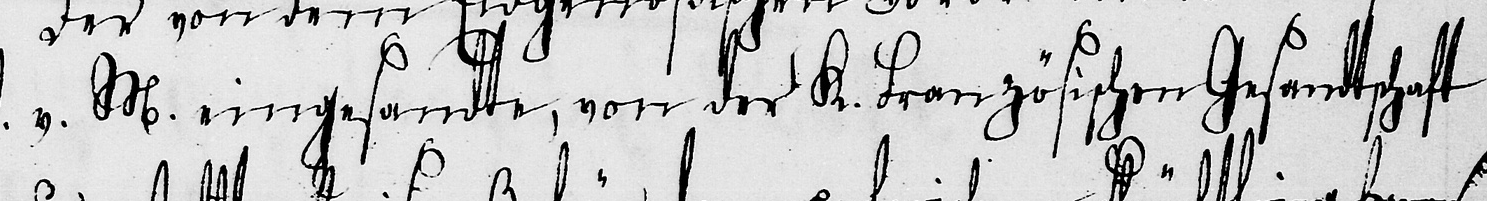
v. M. eingesandte, von der K. Französischen Gesandtschaft
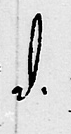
d.
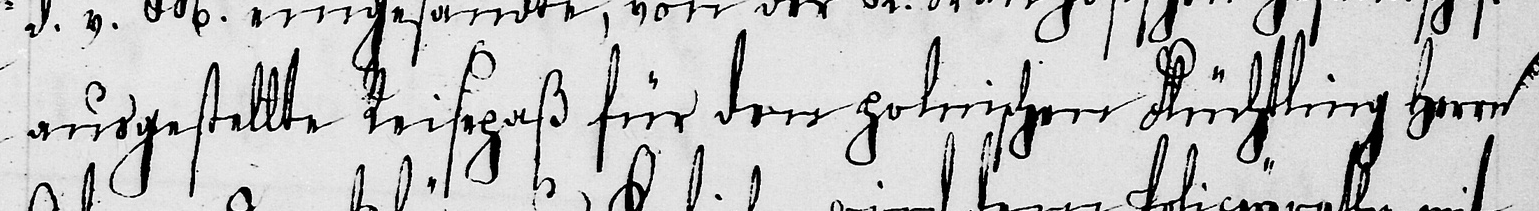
ausgestellte Reisepaß für den polnischen Flüchtling Herrn
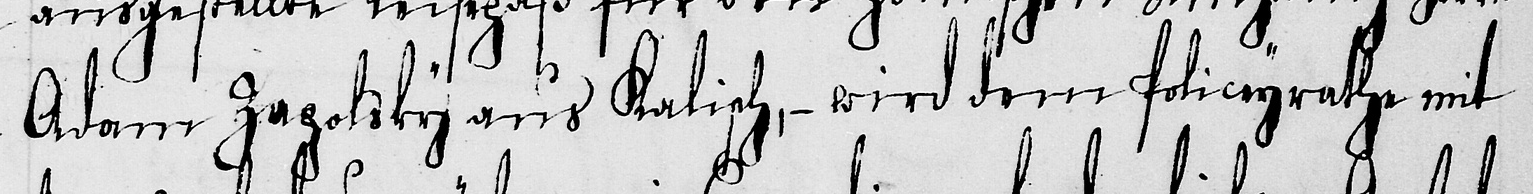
Adam Zapolsky aus Kalisch, – wird dem Policeyrathe mit
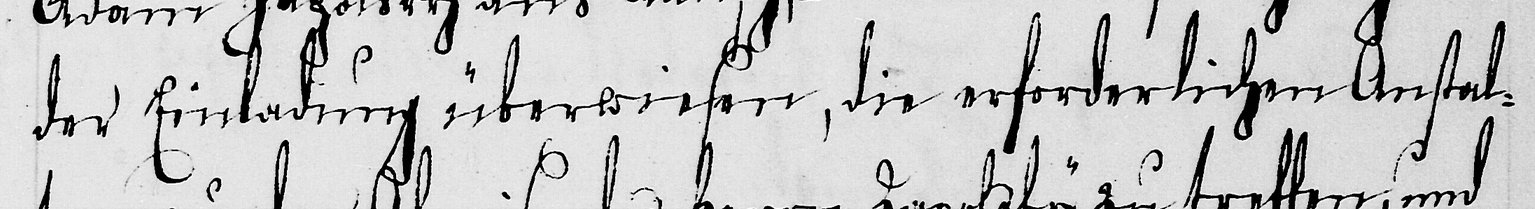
der Einladung überwiesen, die erforderlichen Anstal¬
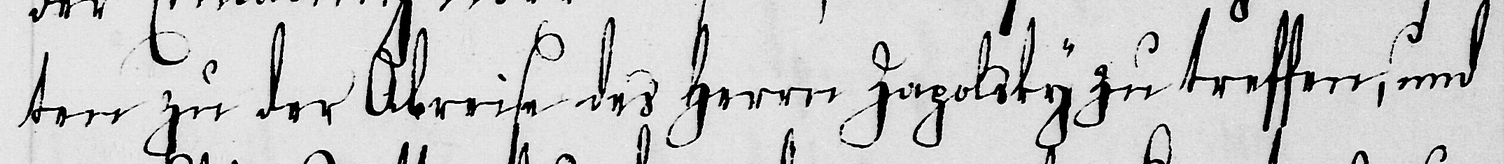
ten zu der Abreise des Herrn Zapolsky zu treffen, und
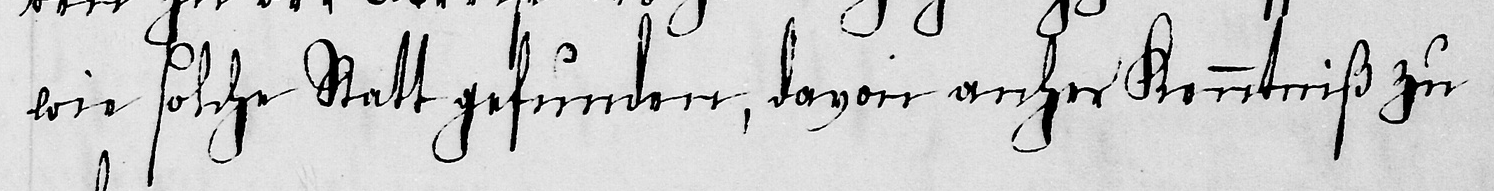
wie solche Statt gefunden, davon anher Kenntniß zu
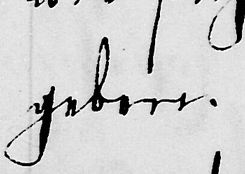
geben.
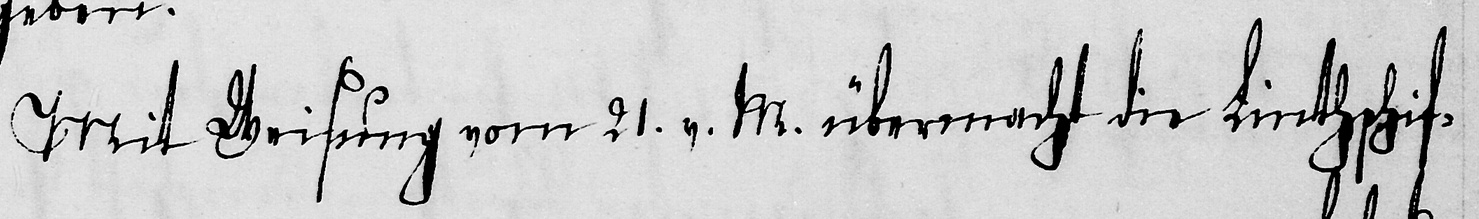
Mit Weisung vom 21. v. M. übermacht die Linthschif-
